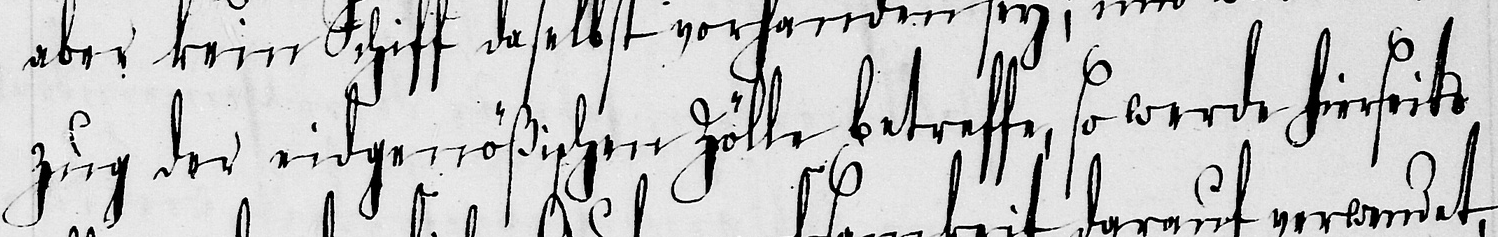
zug der eidgenößischen Zölle betreffe, so werde hiersei¬
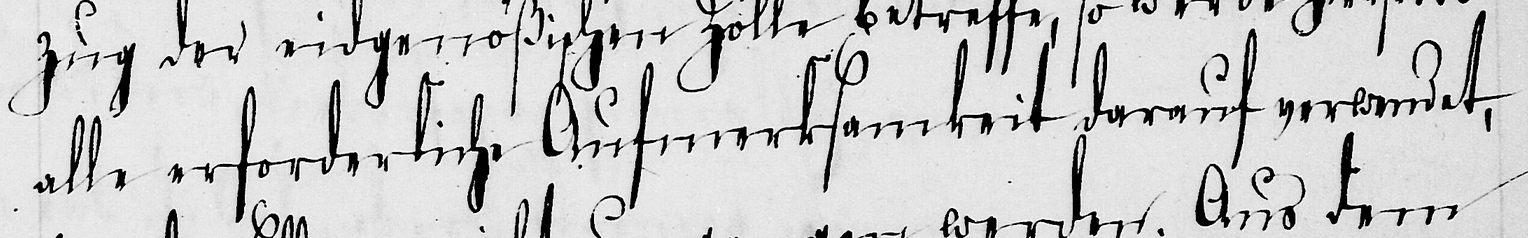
lle erforderliche Aufmerksamkeit darauf verwendet,
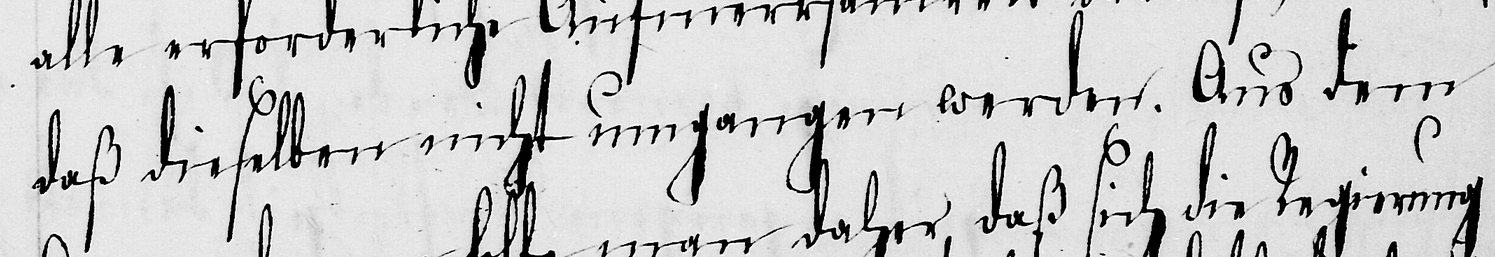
daß dieselben nicht umgangen werden. Aus dem
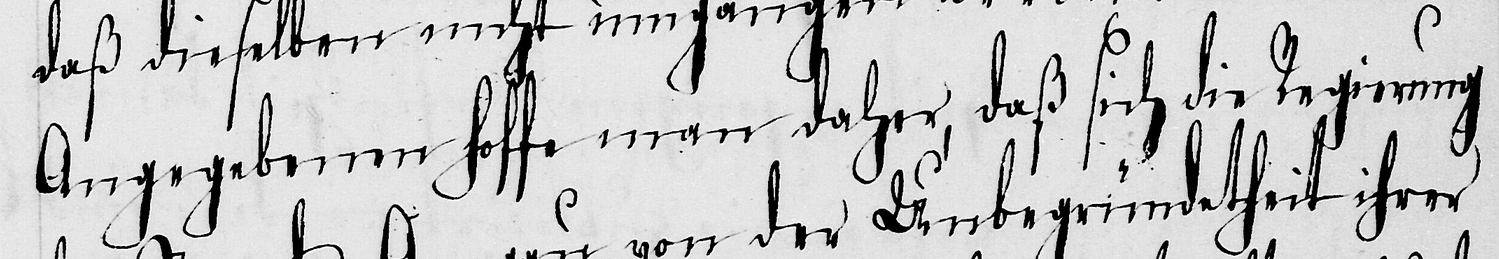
Angegeben hoffe man daher, daß sich die Regierung
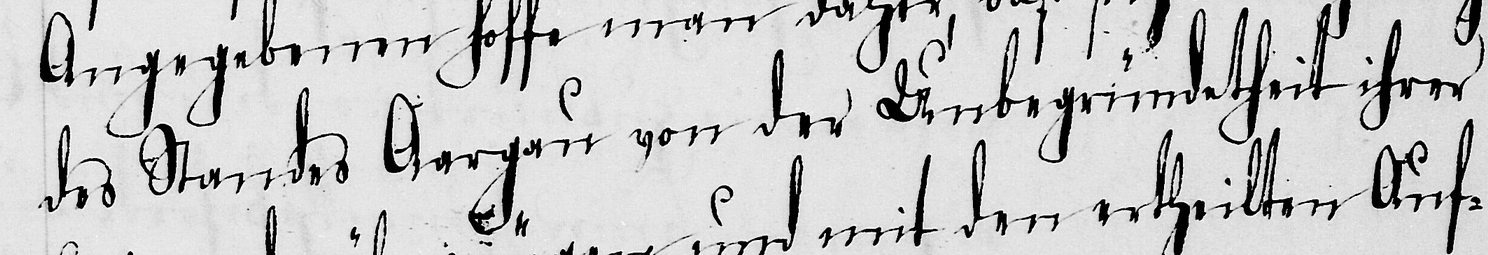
des Standes Aargau von der Unbegründetheit ihrer
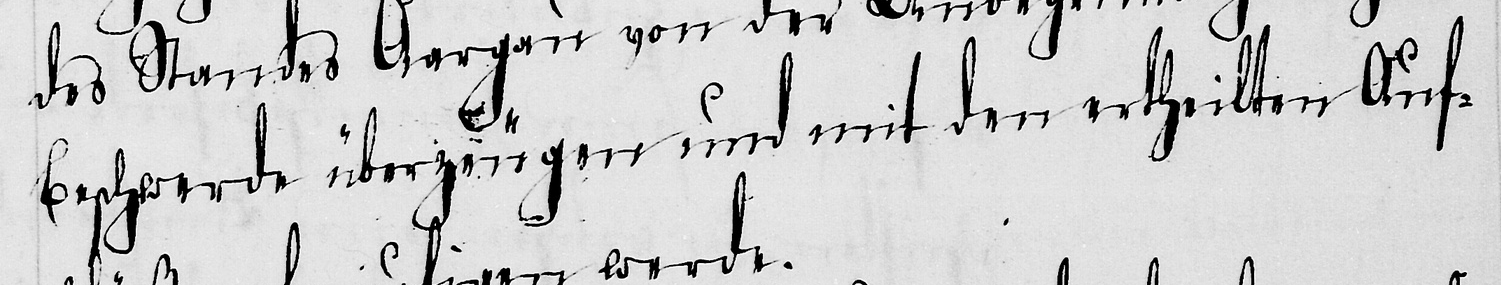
Beschwerde überzeugen und mit den ertheilten Auf¬
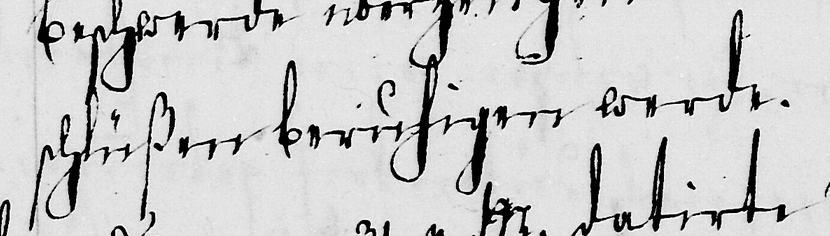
schlüßen beruhigen werde.
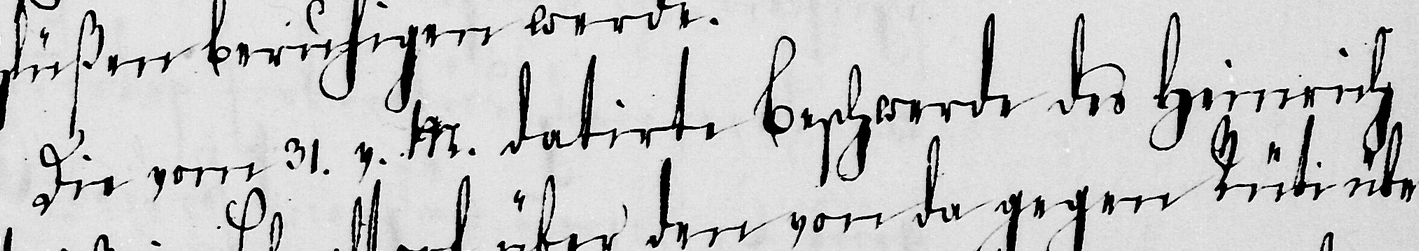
Die vom 31. v. M. datirte Beschwerde des Heinrich
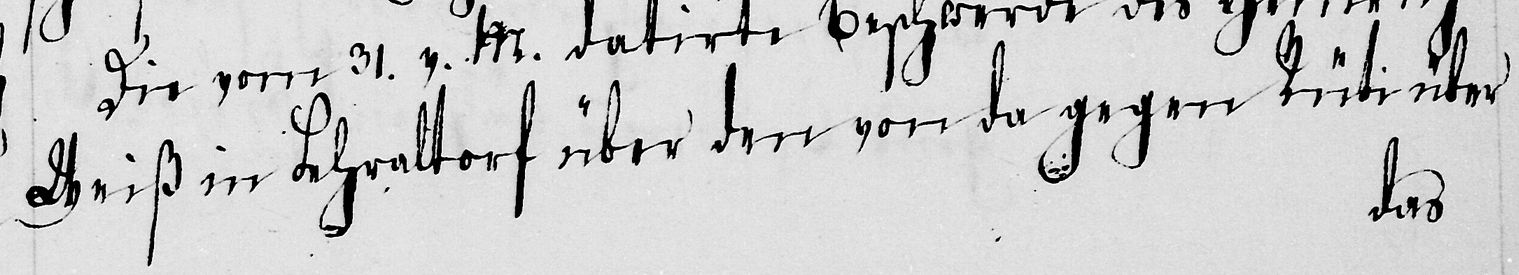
Weiß in Fehraltorf über den von da gegen Rüti über
